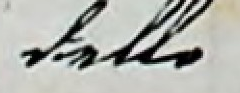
Detto
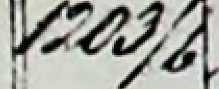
1203/b
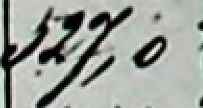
527,0
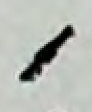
1
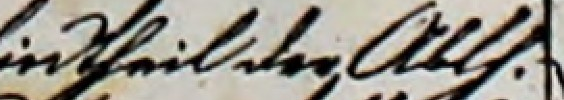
Ein Theil der Abth.
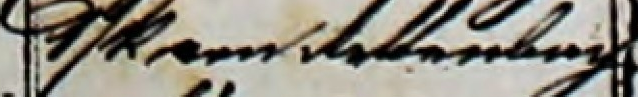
Warn Dettenbach„
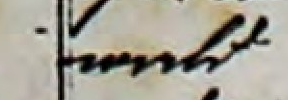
wald
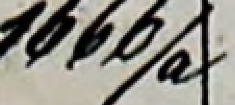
1666/a
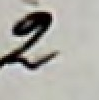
2
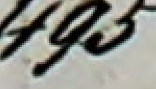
495
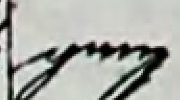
ganz
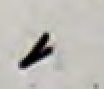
„
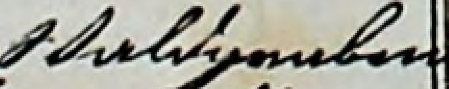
Waldgraben„
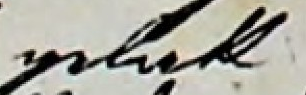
gelak
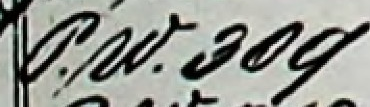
P.W. 309
